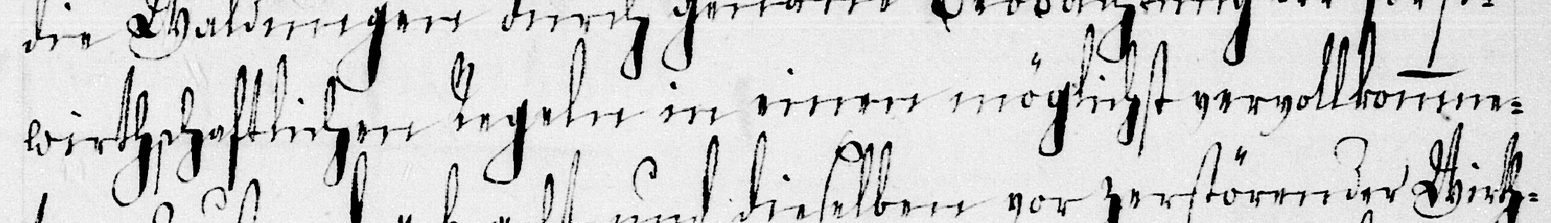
wirthschaftlichen Regeln in einen möglichst vervollkommne¬
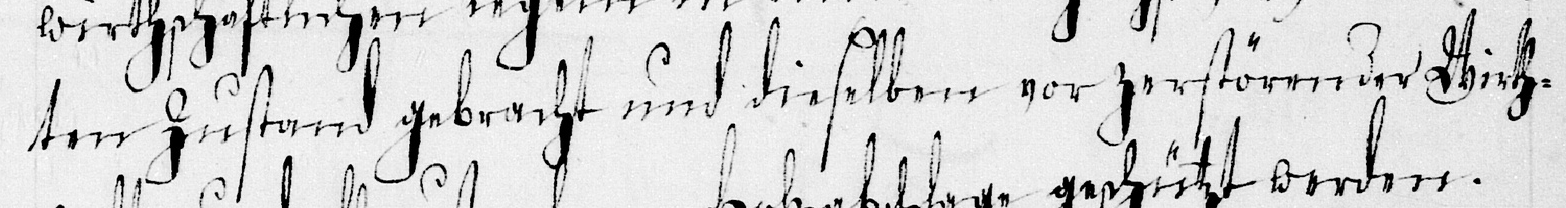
ten Zustand gebracht und dieselben vor zerstörender Wirth¬
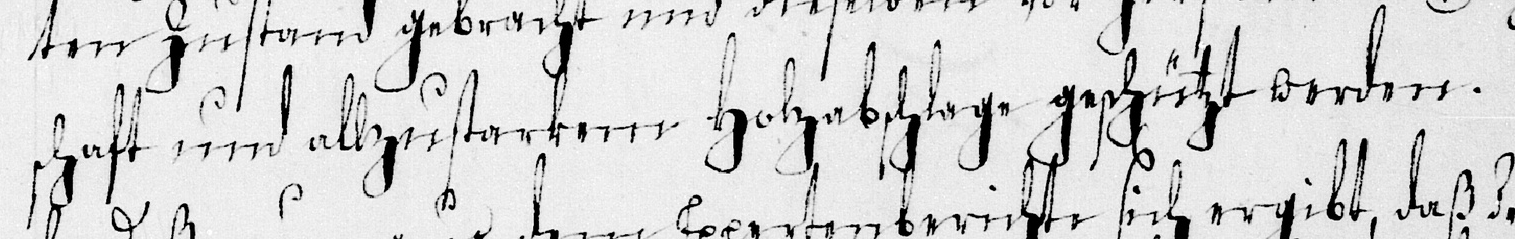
schaft und allzustarkem Holzabschlage geschützt werden.
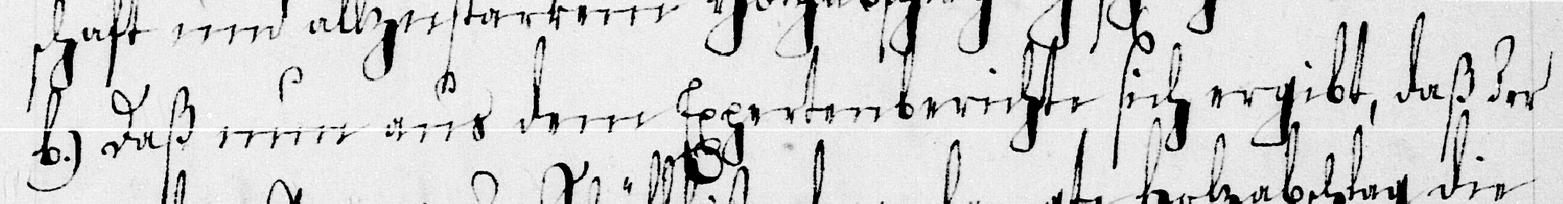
b.) Daß nun aus dem Expertenbericht sich ergibt, daß der
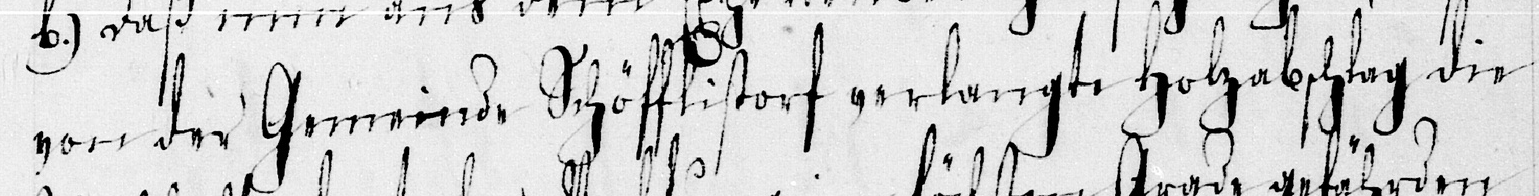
von der Gemeinde Schöfflistorf verlangte Holzabschlag die
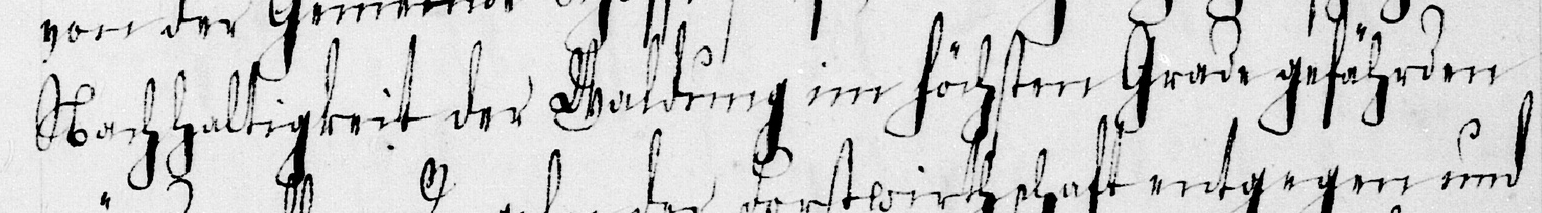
Nachhaltigkeit der Waldung im höchsten Grade gefährden
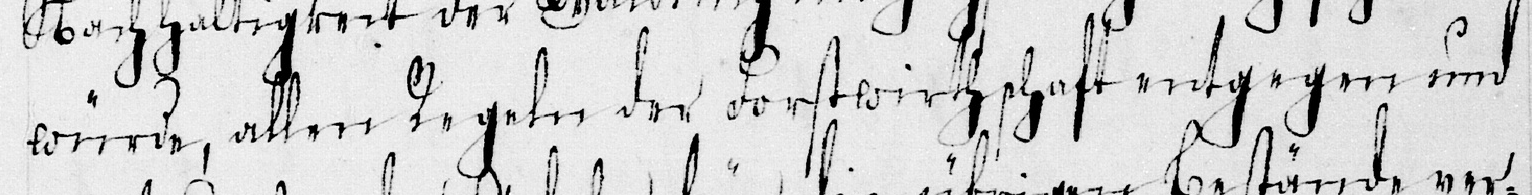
würde, allen Regeln der Forstwirthschaft entgegen und
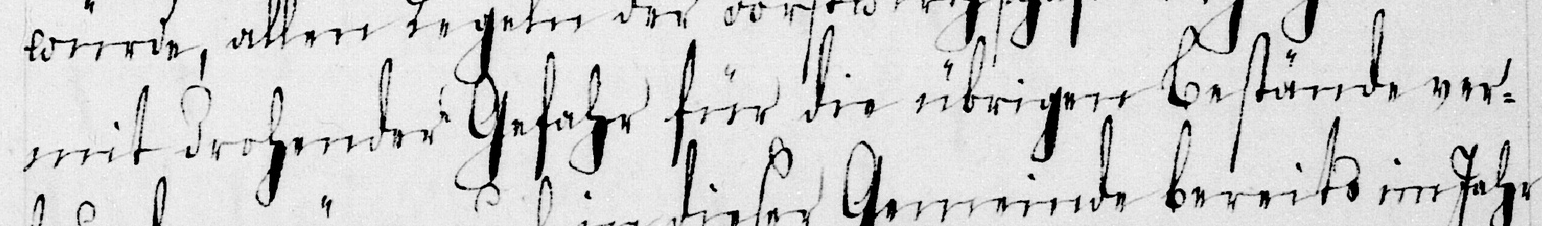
mit drohender Gefahr für die übrigen Bestände ver¬
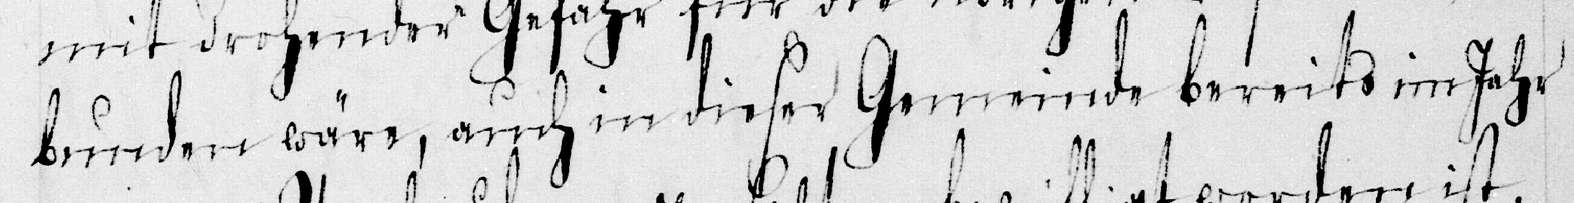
bunden wäre, auch in dieser Gemeinde bereits im Jahr
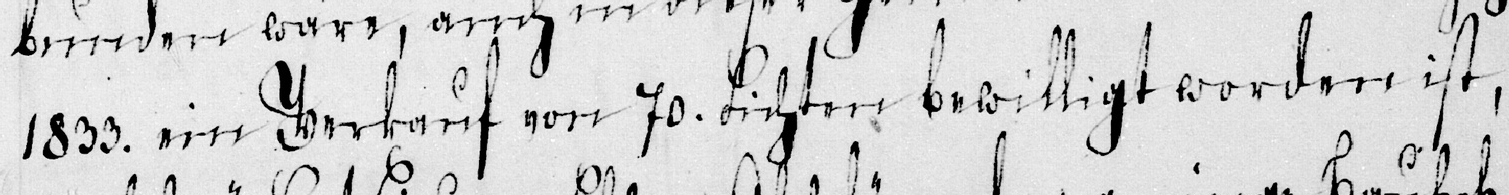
1833. ein Verkauf von 70. Fichten bewilligt worden ist,
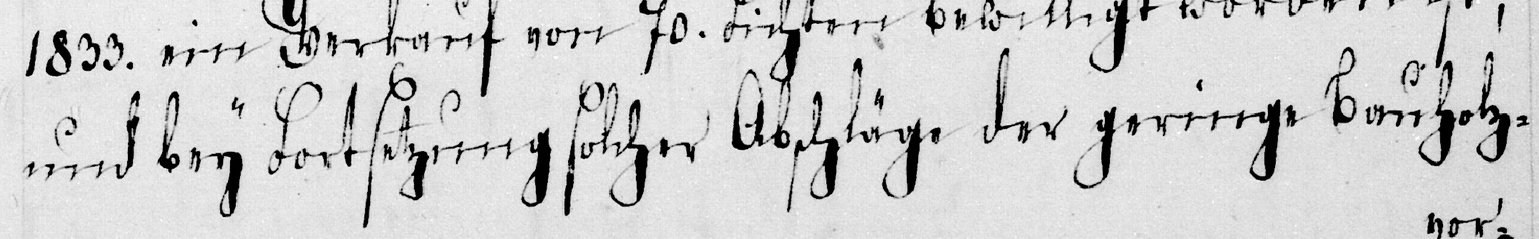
und bey Fortsetzung solcher Abschläge der geringe Bauholz-
